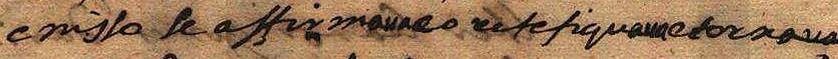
e nisso se affirmaua e o retefiquaua e tornaua
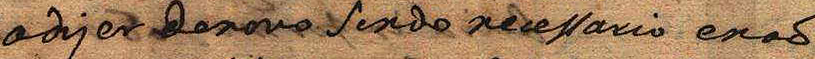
a dizer de nouo sendo necessario e naõ
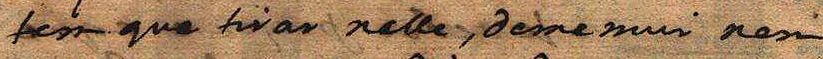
tem que tirar nelle, demenuir nem
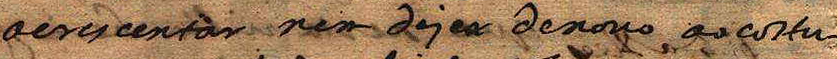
acrescentar nem dizer de nouo ao costu
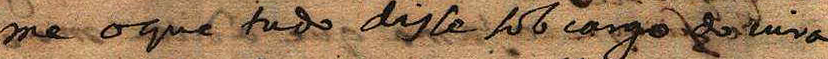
me o que tudo disse sob cargo do iura
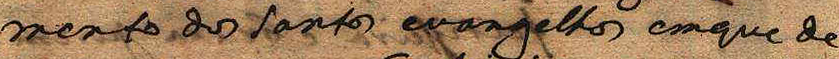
mento dos santos euangelhos em que de
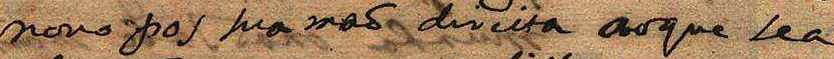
nouo pos sua maõ direita ao que se a
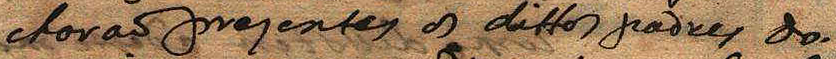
charaõ prezentes os dittos padres do
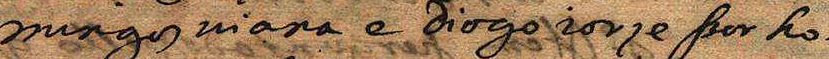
mingos uiana e diogo iorze por ho
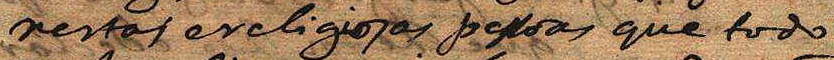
nestas e religiozas pessoas que todo
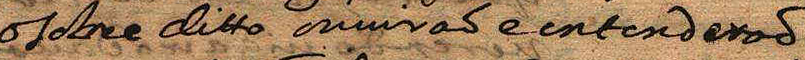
o sobreditto ouuiraõ e entenderaõ
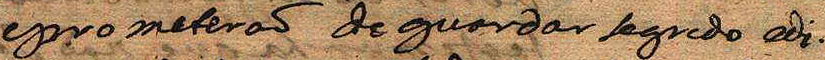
e prometeraõ de guardar segredo e di
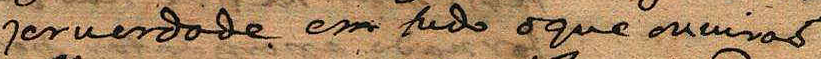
zer uerdade em tudo o que ouuiraõ
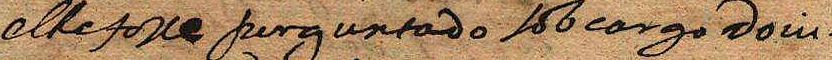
e lhe fosse perguntado sob cargo do iu
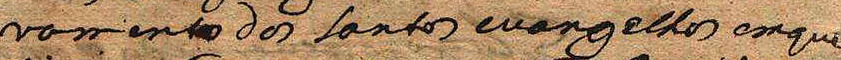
ramento dos santos euangelhos em que
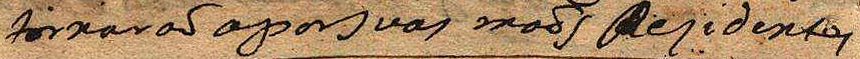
tornaraõ a por suas mãos Rezidentes
